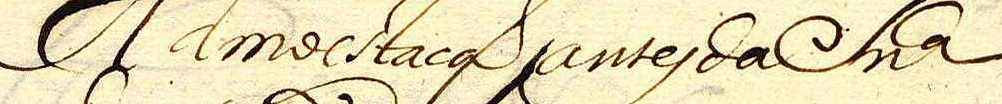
Admoestaçaõ antes da Snça
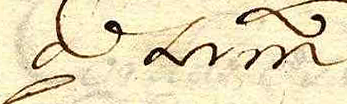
do torm.to
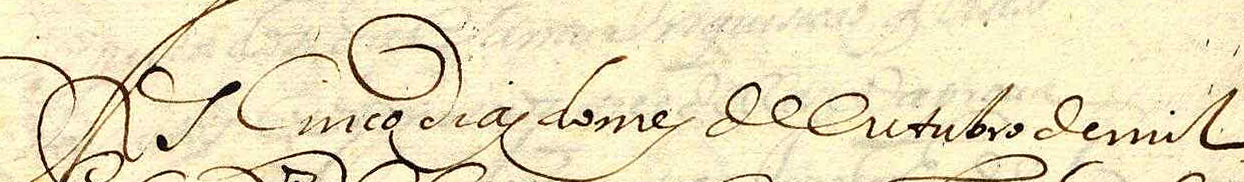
Aos Cinco dias do mes de Outubro de mil
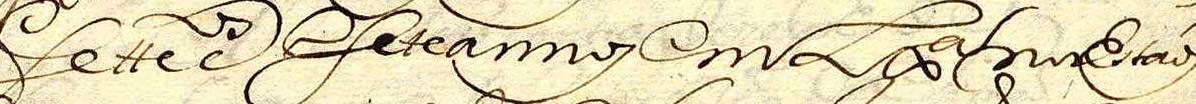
settectos e sete annos em Lxa nos Estáos
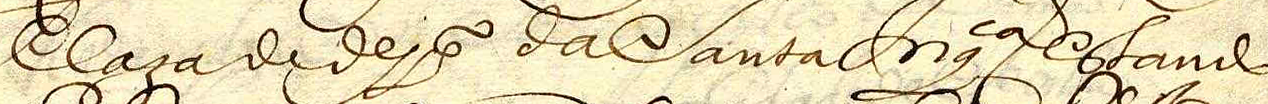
E Caza do despo da Santa Inqçaõ estando
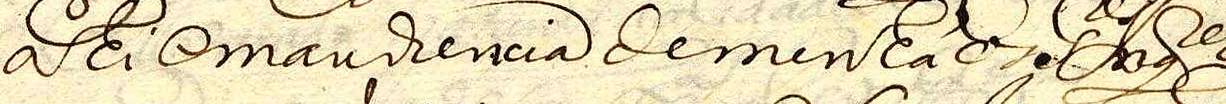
ahi em audiencia de menhã os sres Inqres
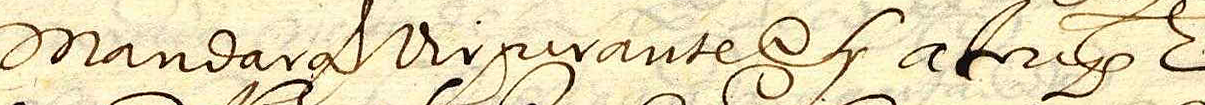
mandaraõ vir perante Sy a Iozeph
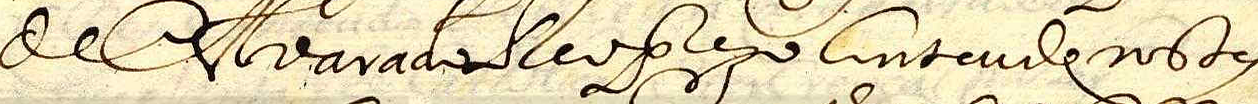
de Alvarado Reo prezo Conteudo nestes
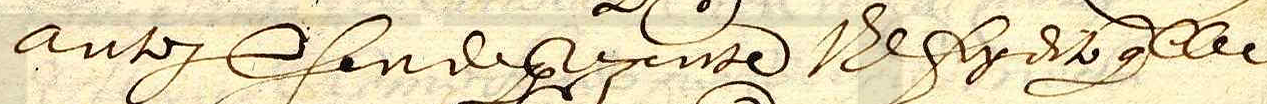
autos e sendo prezente lhe foy dito q̄ elle
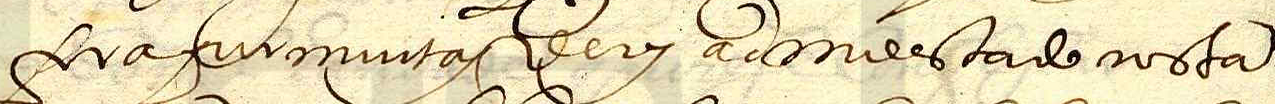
fora por muitas vezes admoestado nesta
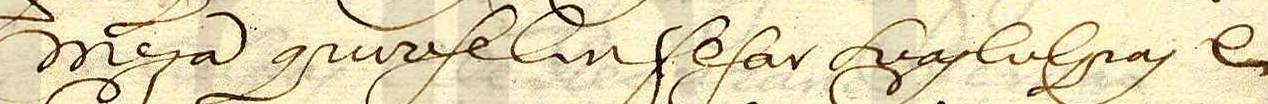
meza quizesse Confesar suas Culpas e
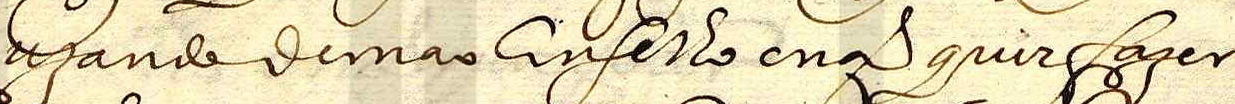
uzando de mao Conselho e naõ quiz fazer
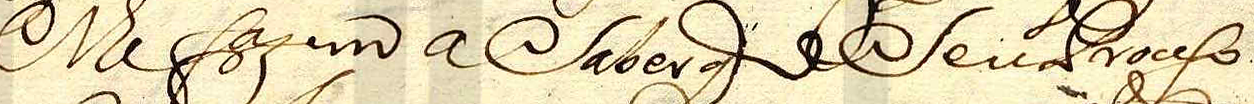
e lhe fazem a Saber q̄ Seu Proceso
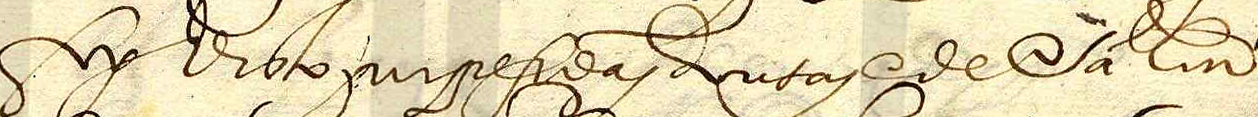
foy visto por pessoas direitas e de Sã Con
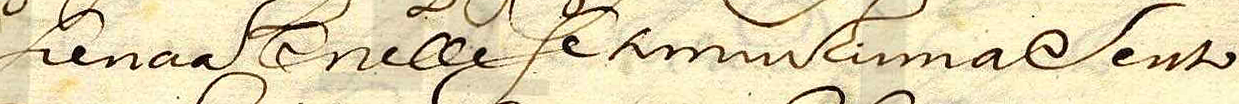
siencia e nelle se tomou hum aSento
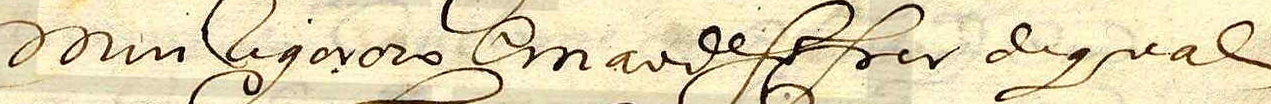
mui Rigorozo em ao de sofrer de qoal
